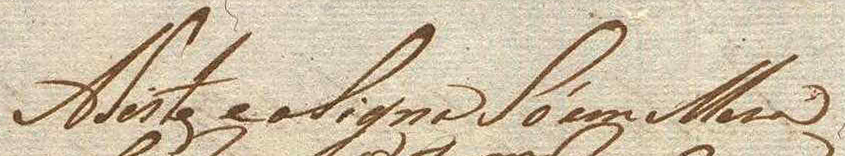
Asiste e aSigna Só em Meza
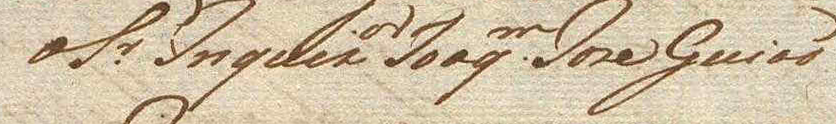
o S.r Inquizor Ioaq.m Ioze Guiaõ
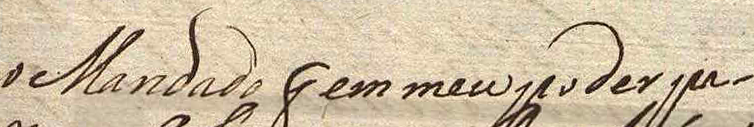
o Mandado q̄ em meu poder pa
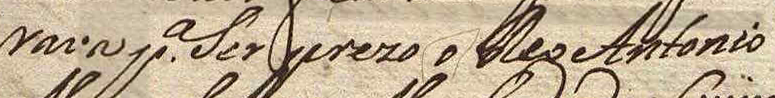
rava p.a ser prezo o Reo Antonio
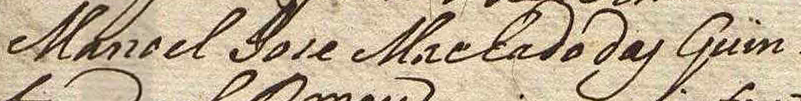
Manoel Iose Machado das Quin
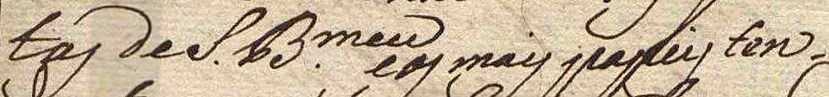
tas de S. B.meu e os mais papeis ten
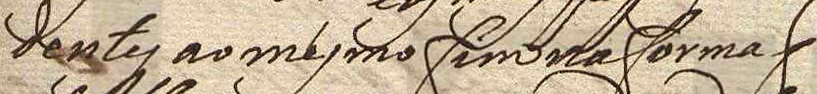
dentes ao mesmo fim na forma q̄
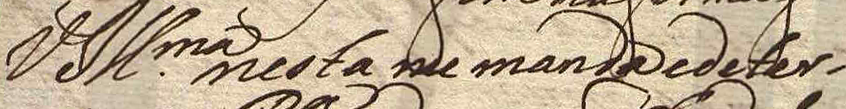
V Ill.ma nesta me manda e deter
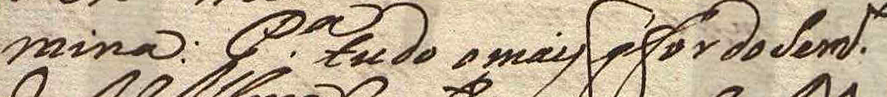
mina: P.a tudo o mais q̄ for do Serv.o
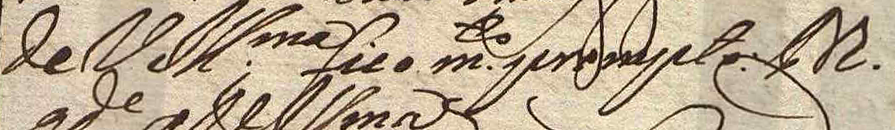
de V ll.ma fico m.to prompto D.s
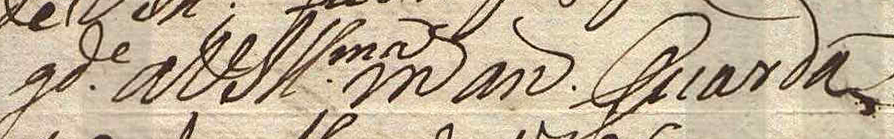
gd.e a V Ill.ma m̄ an̄. Guarda
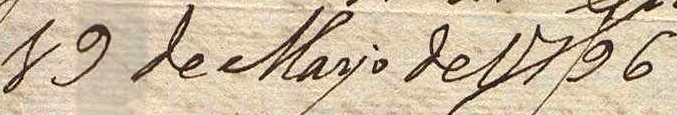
19 de Mayo de 1796
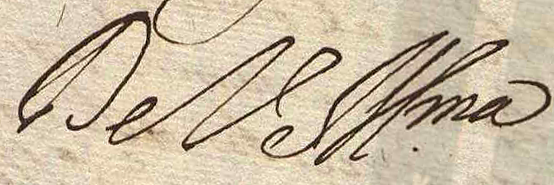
De V Ill.ma
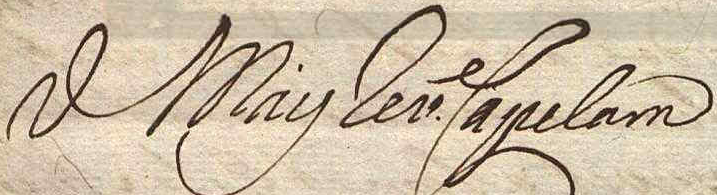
O Mais Rev.e Capelam
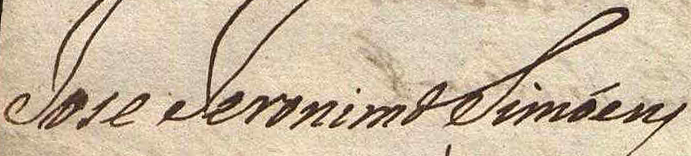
Iose Ieronimo Simõens
